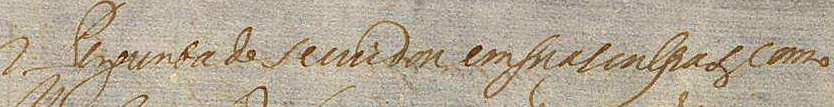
item Perguntado se cuidou em suas culpas como
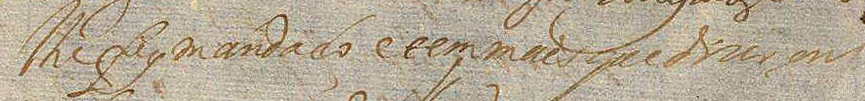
lhe foy mandado e tem mais que dizer, ou
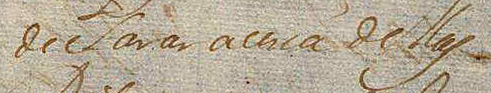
declarar acerca dellas?
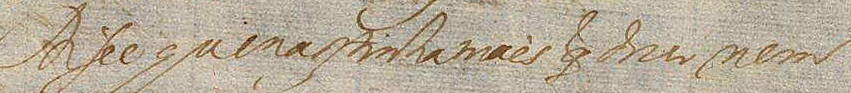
Disse que naõ tinha mais q̄ dizer nem
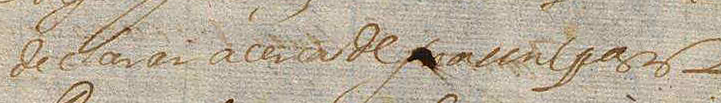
declarar acerca de suas culpas
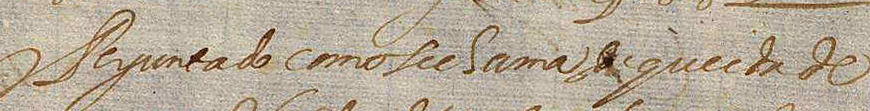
item Perguntado como se chama de que idade
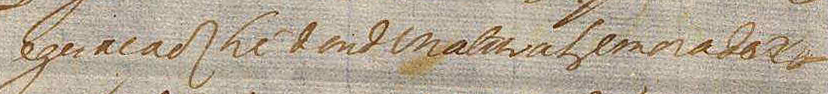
e geraçaõ hé donde natural e morador
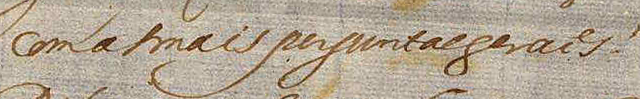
com as mais perguntas geraes?
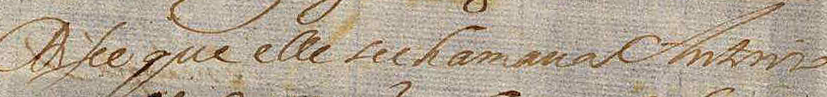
Disse que elle se chamaua Antonio
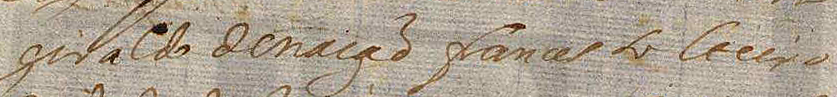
giraldo de naçaõ frances solteiro
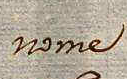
nome
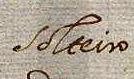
solteiro
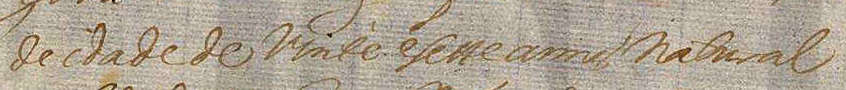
de idade de vinte e sette annos natural
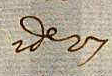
ide 27
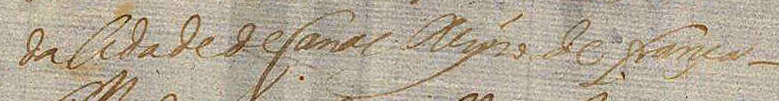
da Cidade de Canas Reyno de frança
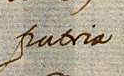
patria
